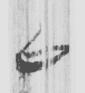㠯（以）
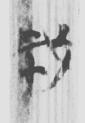戎
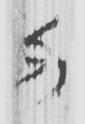力
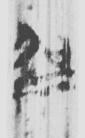{弓口二}
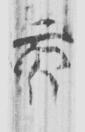而
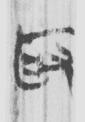取
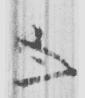之
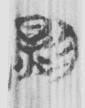則
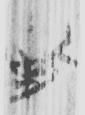{才匕}
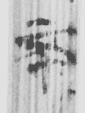不
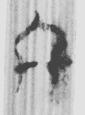夂
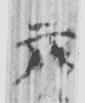亓
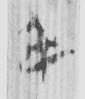身
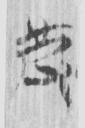皮
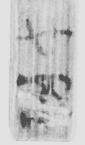{廿五}
